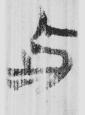此
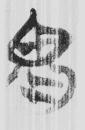胃
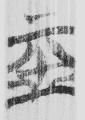亞
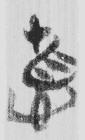惪
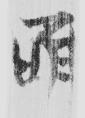唯
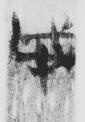成
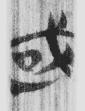或
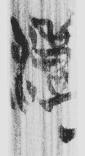{水𠁁}
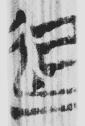起
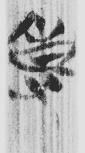事
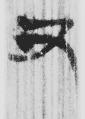又
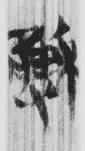穫
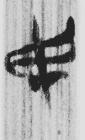民
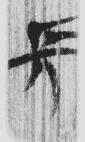長
